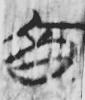亯
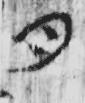月
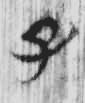子
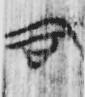司
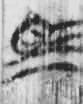馬
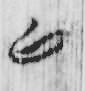㠯
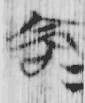命
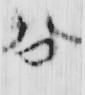公
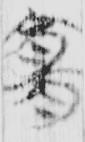宜
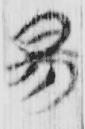昜（陽）
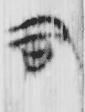司
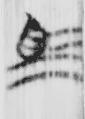馬
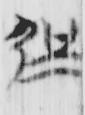強
